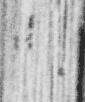也
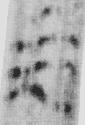而
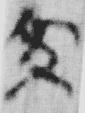交
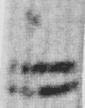㠯（以）
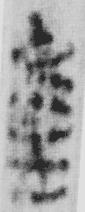惪（德）
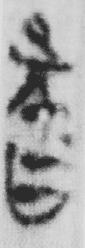者
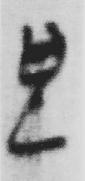也
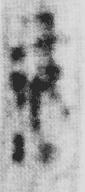不
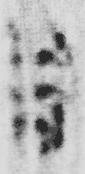同
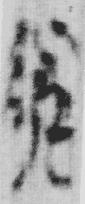兌（悅）
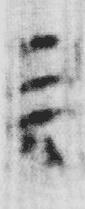而
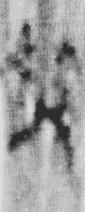交
